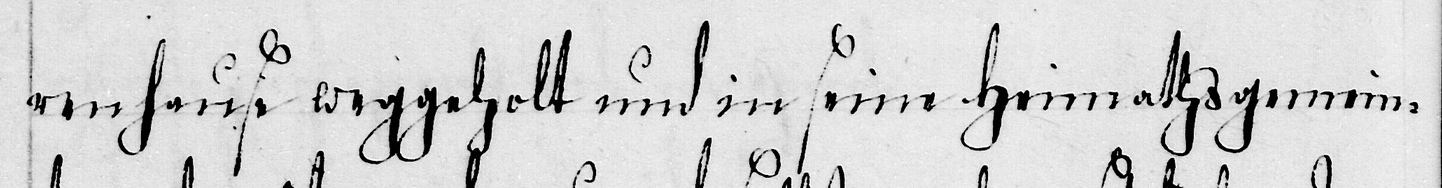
renhause weggeholt und in seine Heimathsgemein¬
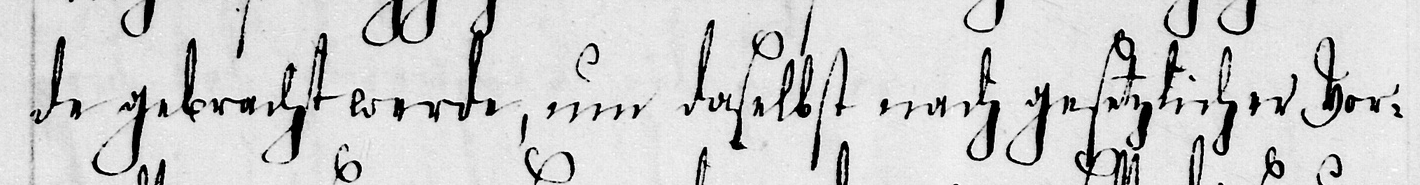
de gebracht werde, um daselbst nach gesetzlicher Vor¬
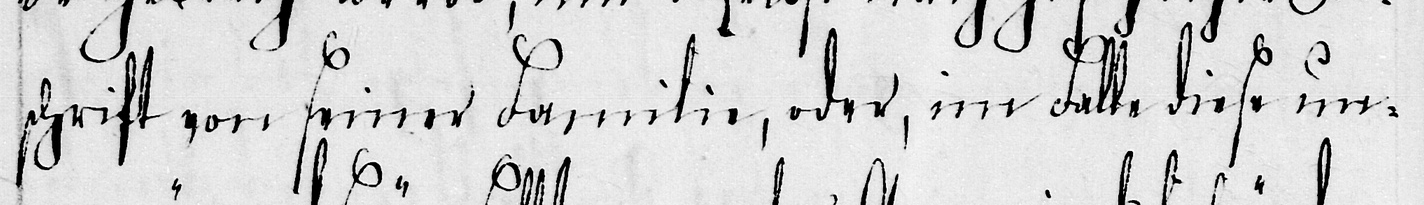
schrift von seiner Familie, oder im Falle diese um¬
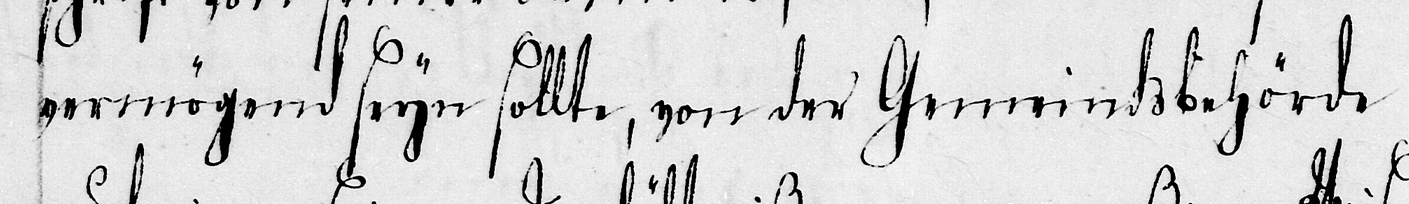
vermögend seyn sollte, von der Gemeindsbehörde
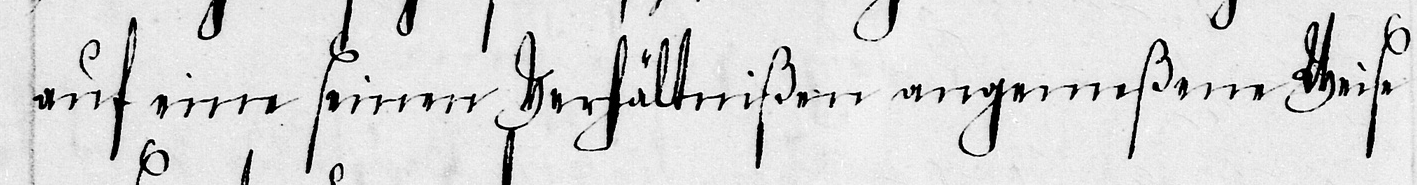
auf eine seinen Verhältnißen angemeßene Weise
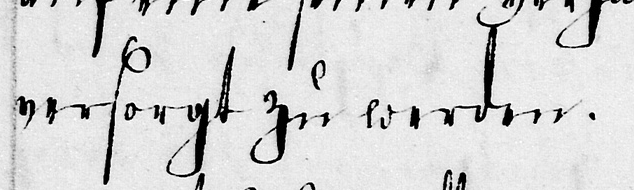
versorgt zu werden.
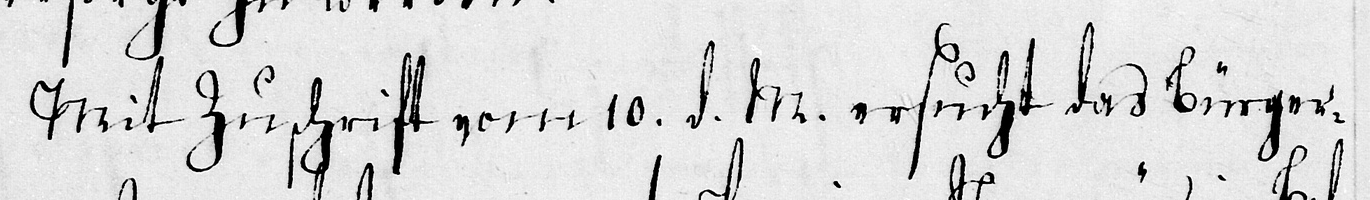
Mit Zuschrift vom 10. d. M. ersucht das Bürger¬
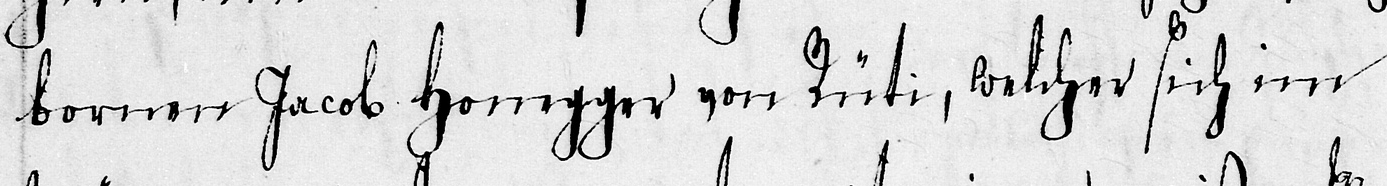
bornen Jacob Honegger von Rüti, welcher sich im
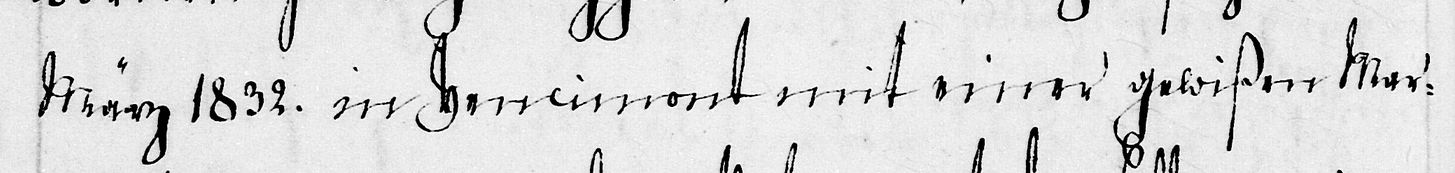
März 1832. in Vencimont mit einer gewißen Mar¬
